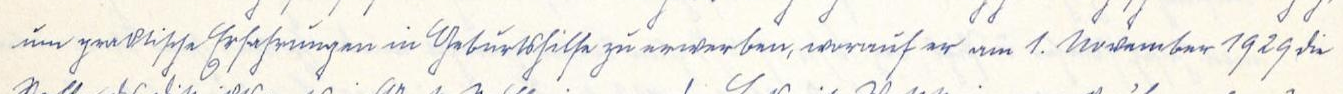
um praktische Erfahrungen in Geburtshilfe zu erwerben, worauf er am 1. November 1929 die
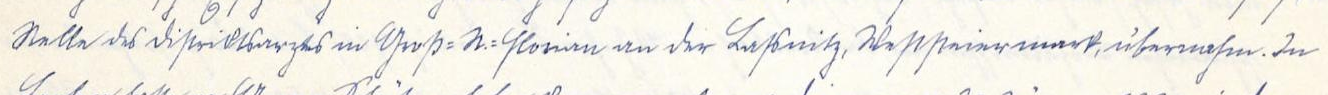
Stelle des Distriktarztes in Groß- St. Florian an der Lassnitz, Weststeiermark, übernahm. In
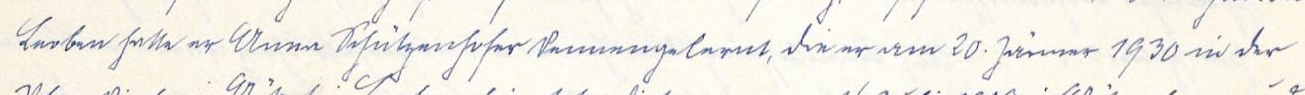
Leoben hatte er Anna Schützenhofer kenengelernt, die er am 20. Jänner 1930 in der
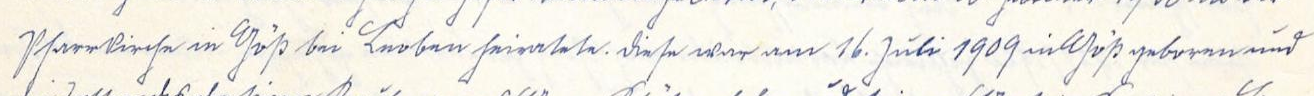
Pfarrkirche in Göß bei Leoben heiratete. Diese war am 16. Juli 1909 in Göß geboren und
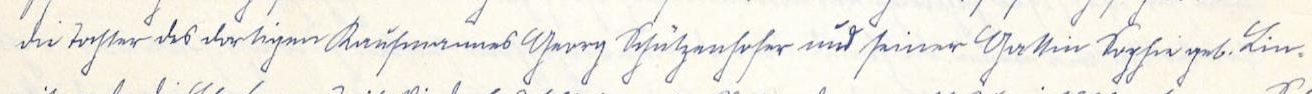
die Tochter des dortigen Kaufmanns Georg Schützenfofer und seiner Gattin Sophie geb. Lin-
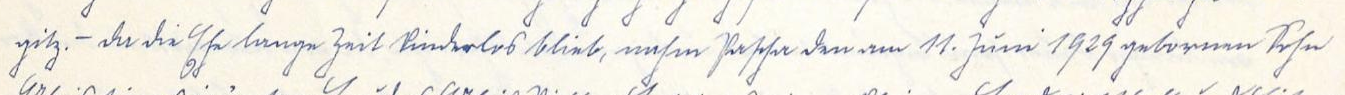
gitz. Da die Ehe lange Zeit kinderlos blieb, nahm Pascha den am 11. Juni 1929 geborenen Sohn
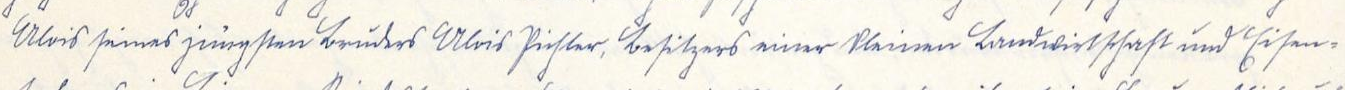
Alois seines jüngsten Bruder Alois Pichler, Besitzers einer kleinen Landwirtschaft und Eisen-
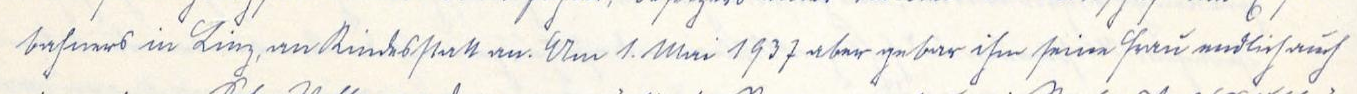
bahners in Linz, an Kindesstatt an. Am 1. Mai 1937 aber gebar ihm seine Frau endlich auch
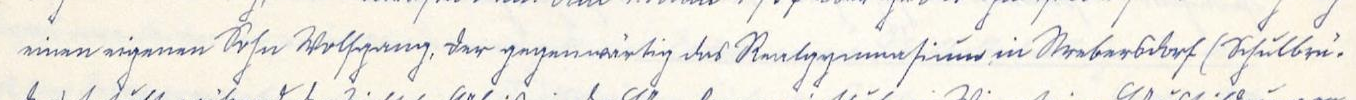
einen eigenen Sohn Wolfgang, der gegenwärtig das Realgymnasium in Strebersdorf (Schulbrü-
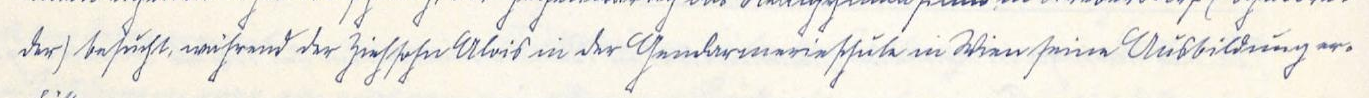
der) besucht, während der Ziehsohn Alois in der Gendarmerieschule in Wien seine Ausbiuldung er-
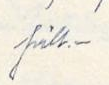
hält.
